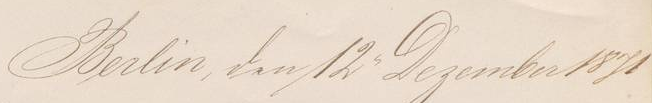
Berlin, den 12t Dezember 1871
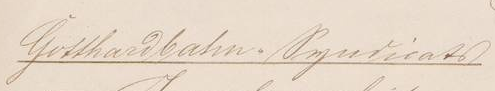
Gotthardbahn-Syndicats
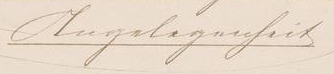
Angelegenheit
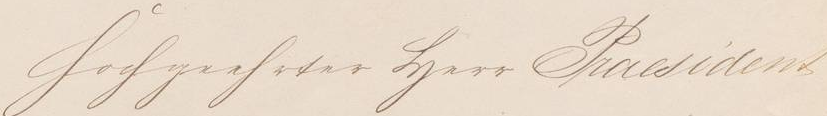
Hochgeehrter Herr Praesident
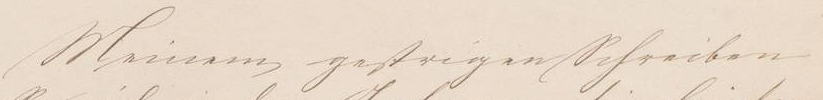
Meinem gestrigen Schreiben
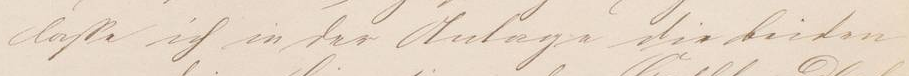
laße ich in der Anlage die beiden
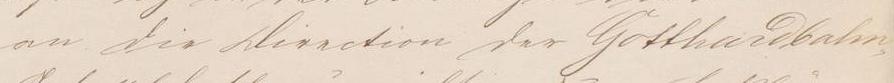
an die Direction der Gotthardbahn-
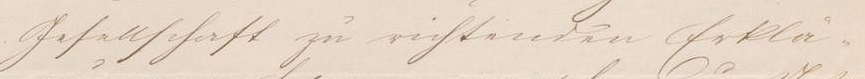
Gesellschaft zu richtenden Erklä-
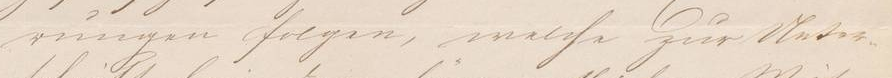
rungen folgen, welche zur Unter-
